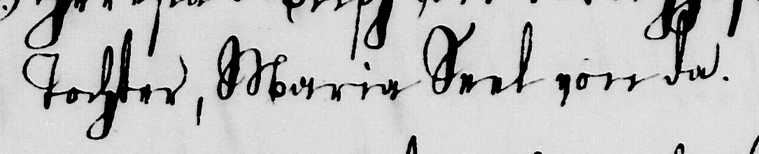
Tochter, Maria Seel von da.
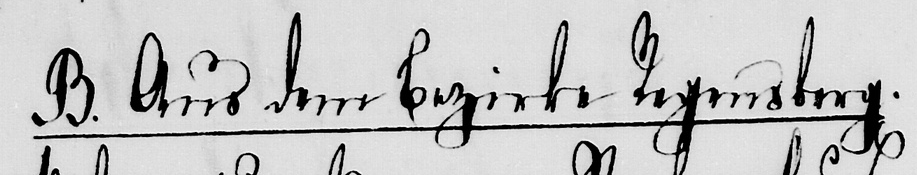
B. Aus dem Bezirke Regensberg.
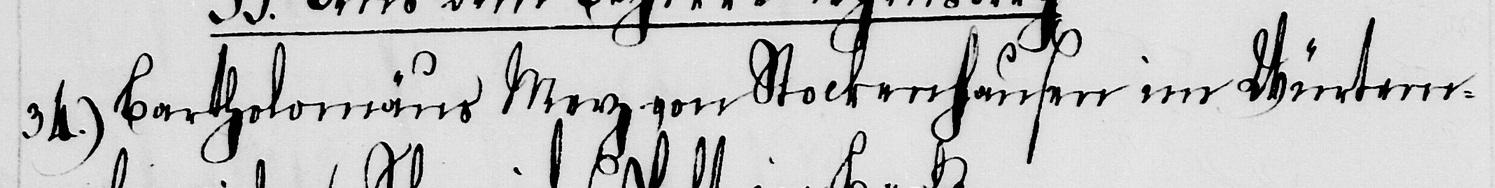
34.) Bartholomäus Mez von Stockenhausen im Würtem¬
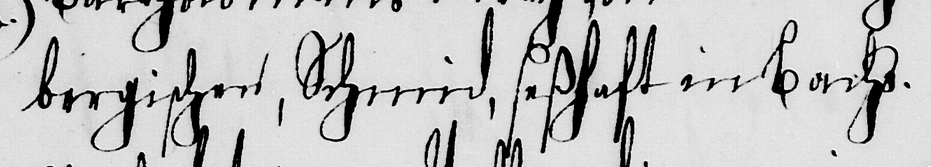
bergischen, Schmid, seßhaft in Bachs.
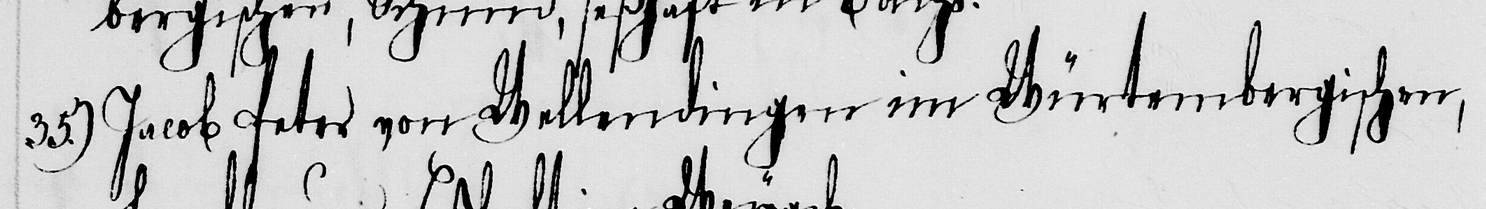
35.) Jacob Peter von Wellendingen im Würtembergischen,
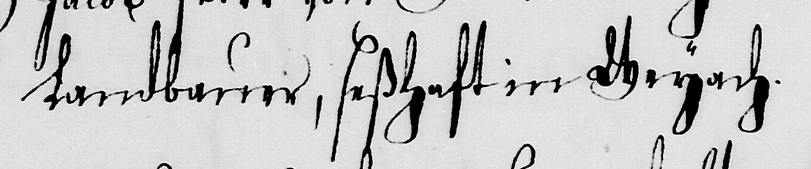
Landbauer, seßhaft in Weyach.
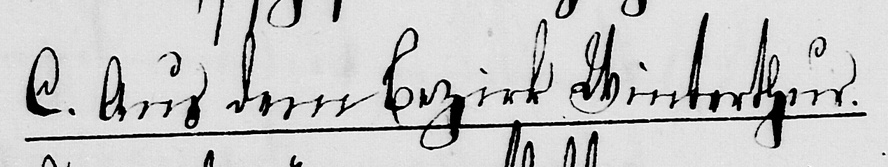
C. Aus dem Bezirk Winterthur.
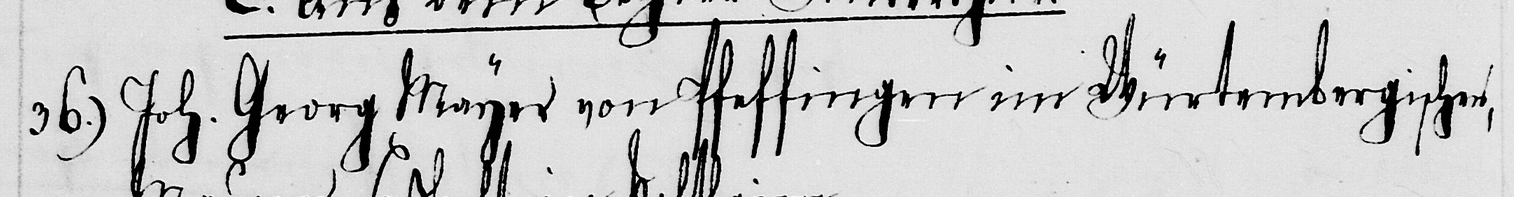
36.) Joh. Georg Mayer von Pfeffingen im Würtembergischen,
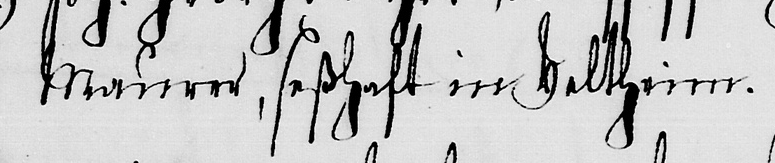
Maurer seßhaft im Veltheim.
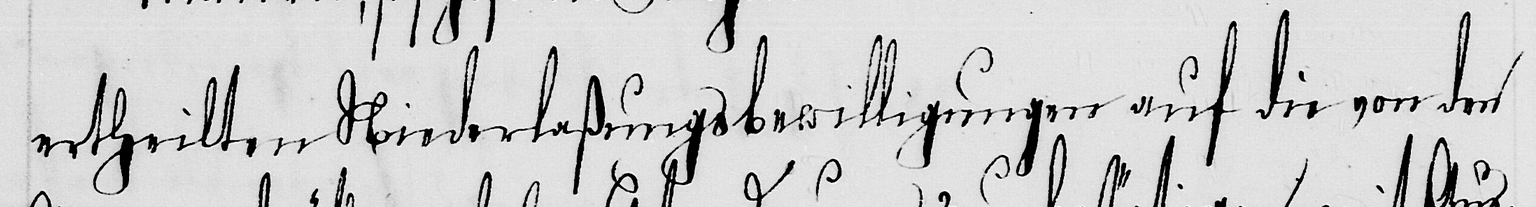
ertheilten Niederlaßungsbewilligungen auf die von den
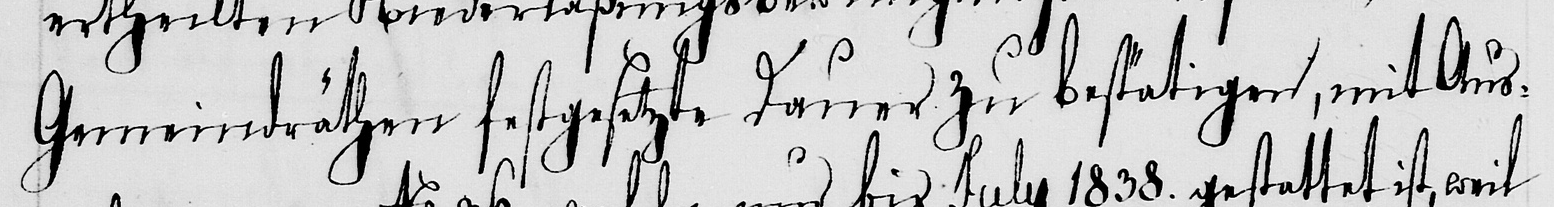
Gemeindräthen festgesetzte Dauer zu bestätigen, mit Aus¬
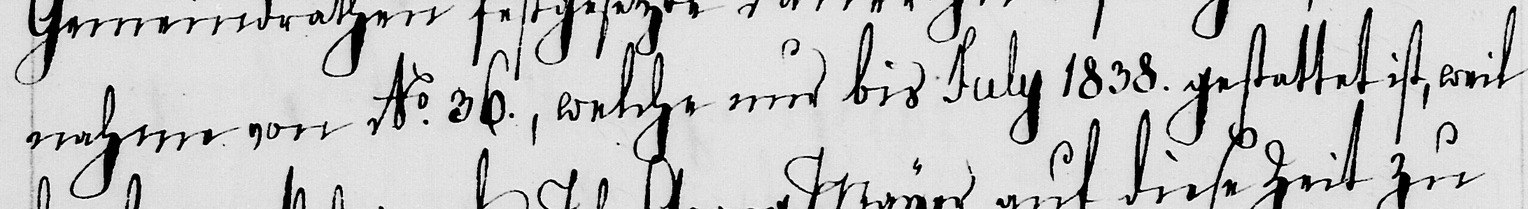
nahme von No. 36., welche nur bis July 1838. gestattet ist, weil
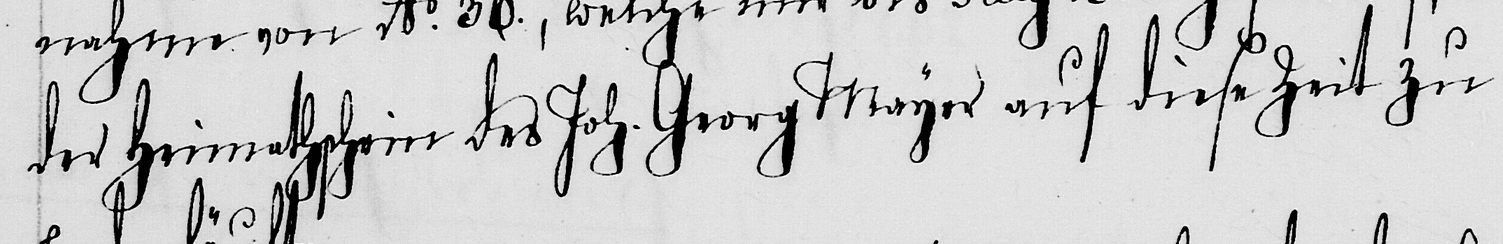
der Heimathschein des Joh. Georg Mayer auf diese Zeit zu
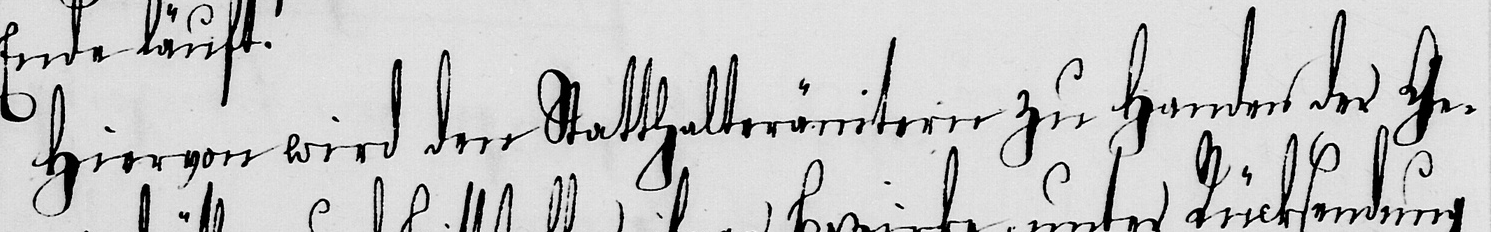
Hiervon wird den Statthalterämtern zu Handen der Gem¬
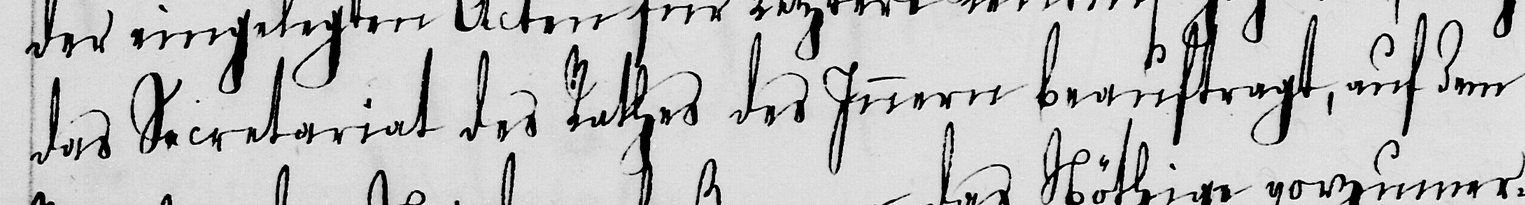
das Secretariat des Rathes des Innern beauftragt, auf dem
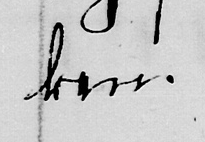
ken.
